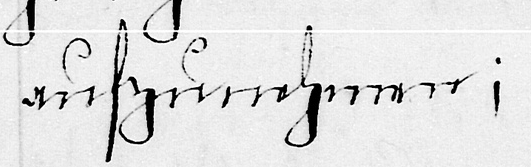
aufzunehmen;
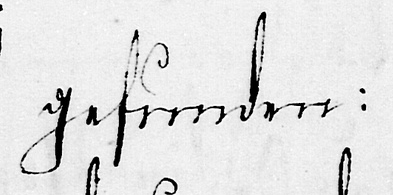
gefunden:
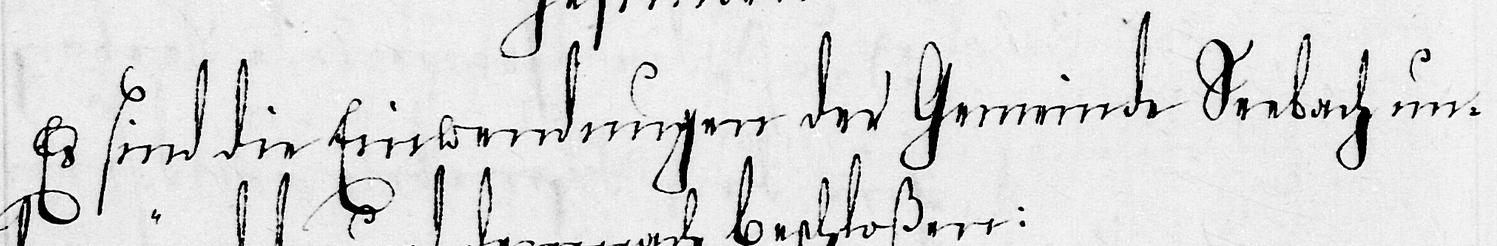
Es sind die Einwendungen der Gemeinde Seebach un¬
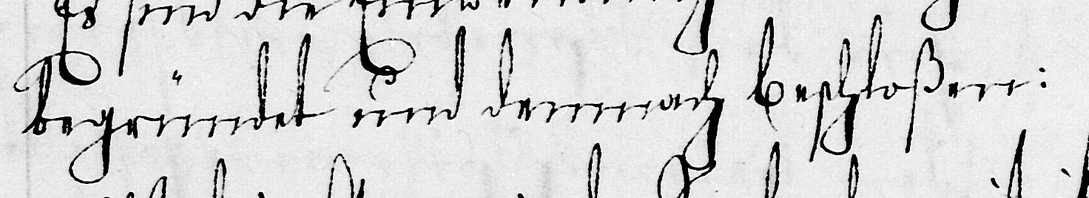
begründet und demnach beschloßen:
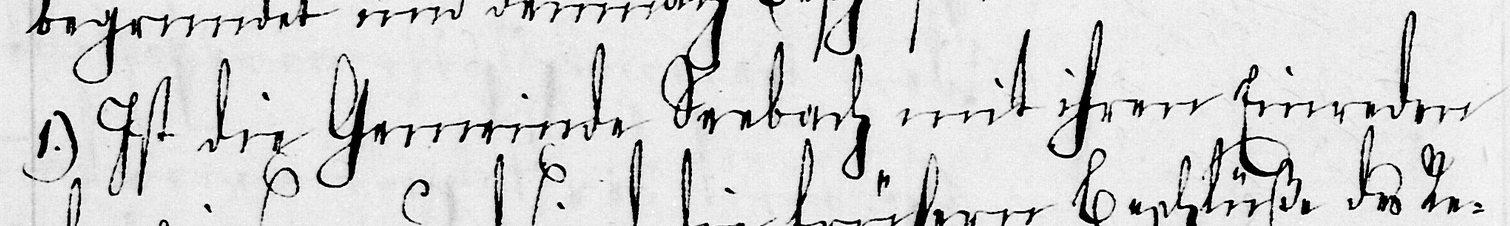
1.) Ist die Gemeinde Seebach mit ihren Einreden
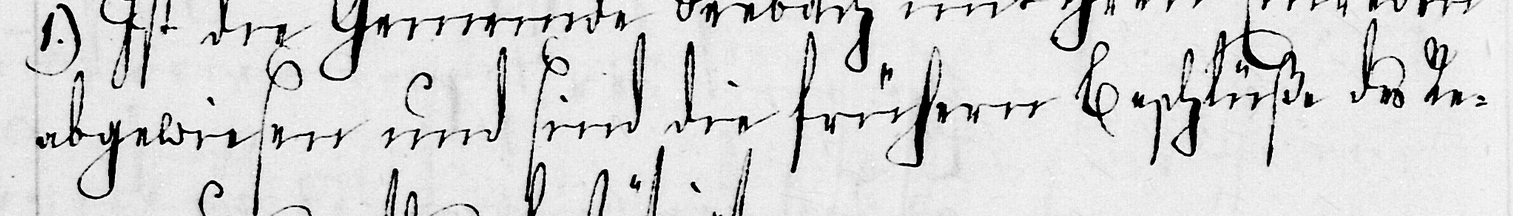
abgewiesen und sind die frühern Beschlüße des Re¬
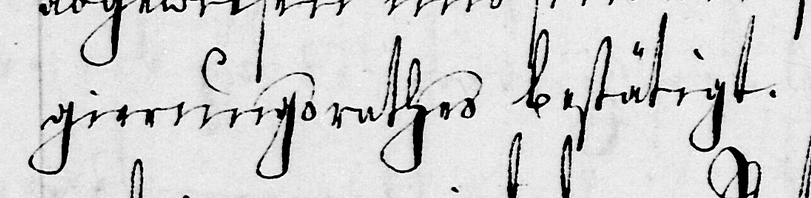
gierungsrathes bestätigt.
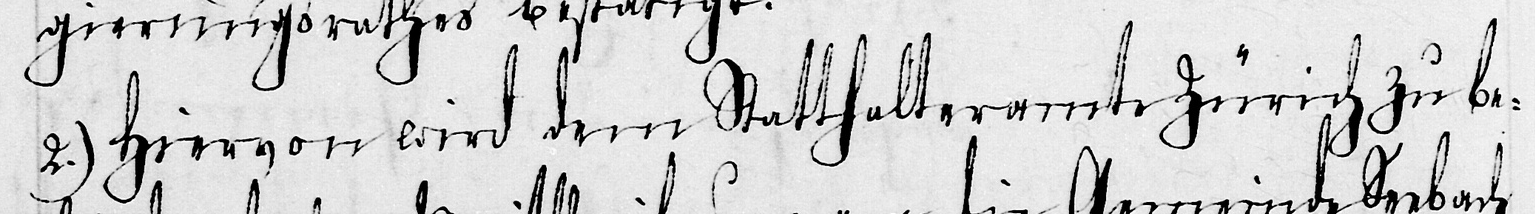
2.) Hiervon wird dem Statthalteramte Zürich zu be¬
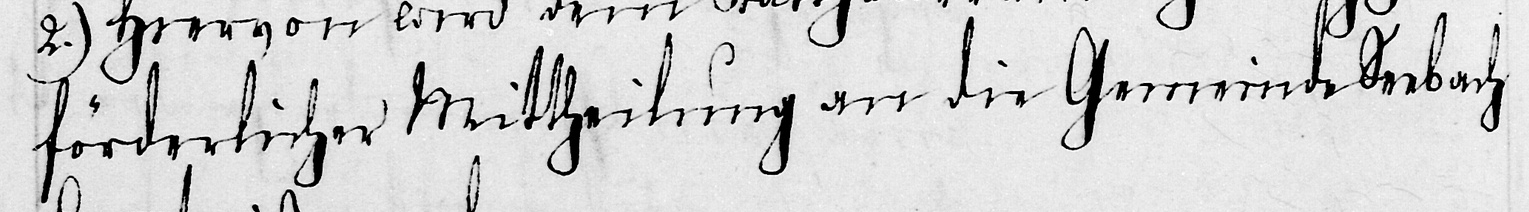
förderlicher Mittheilung an die Gemeinde Seebach
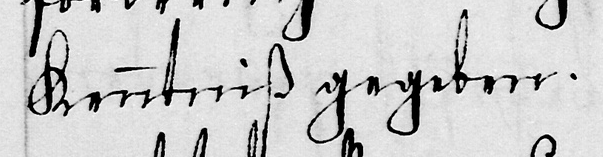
Kenntniß gegeben.
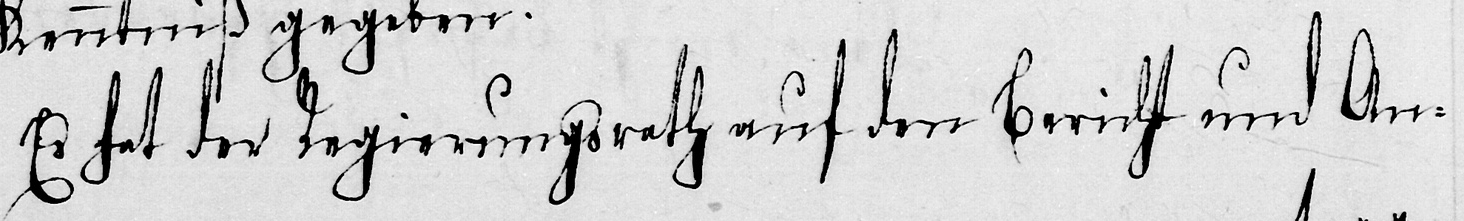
Es hat der Regierungsrath auf den Bericht und An-
